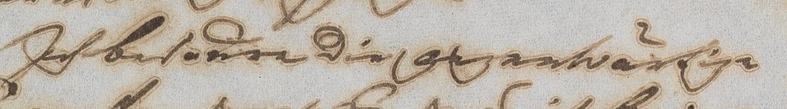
Ich bedaure die gegenwärtige
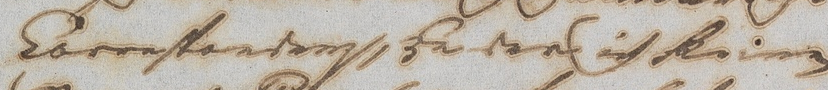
Correspondenz, zu der ich keine
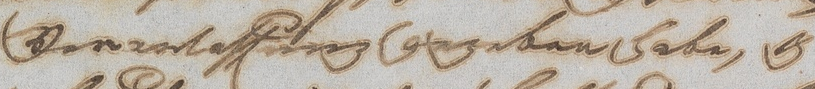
Veranlassung gegeben habe, &
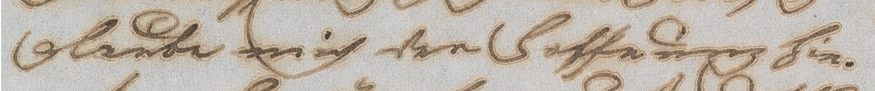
glaube mich der Hoffnung hin-
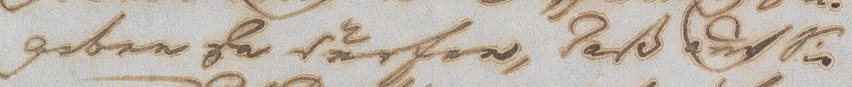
geben zu dürfen, daß auch Sie
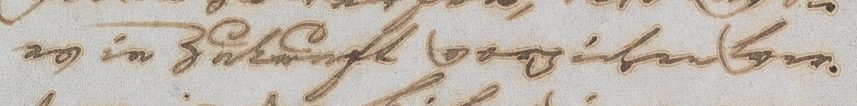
es in Zukunft vorziehen wer-
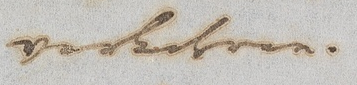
verkehren.
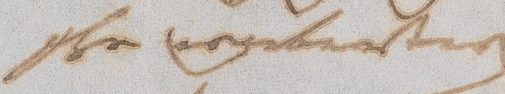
Ihr ergebenster
